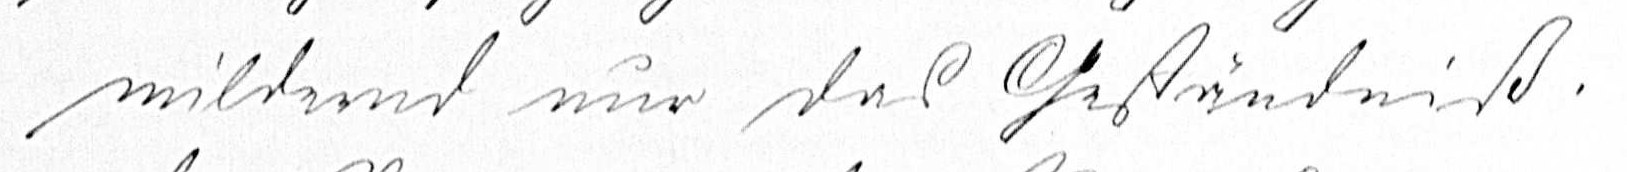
mildernd nur das Geständnis.
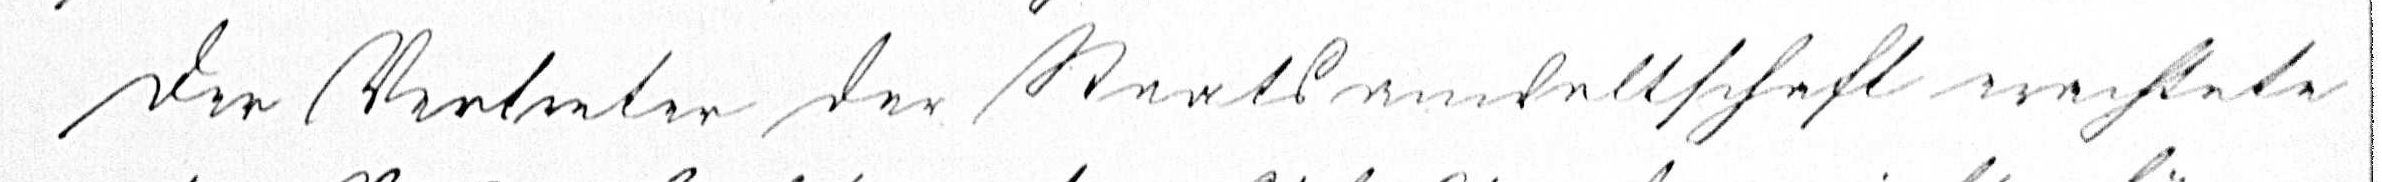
Der Vertreter der Staatsanwaltschaft erachtete
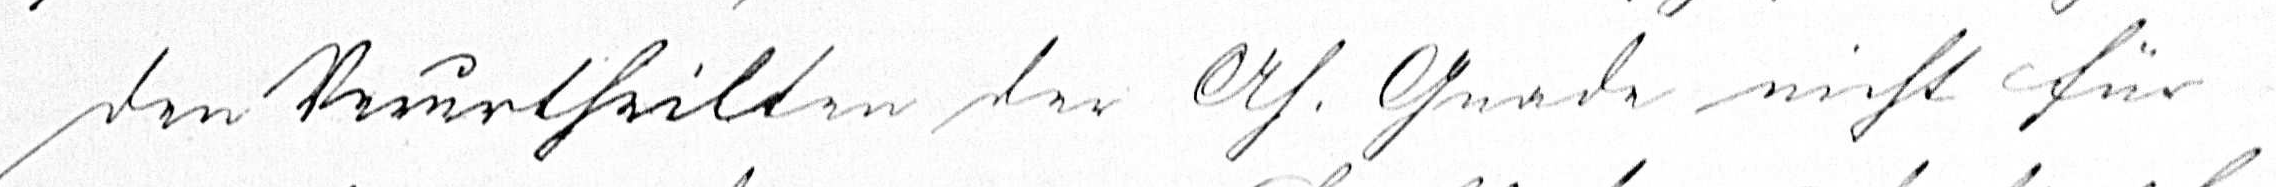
den Verutheilten der Ah. Gnade nicht für
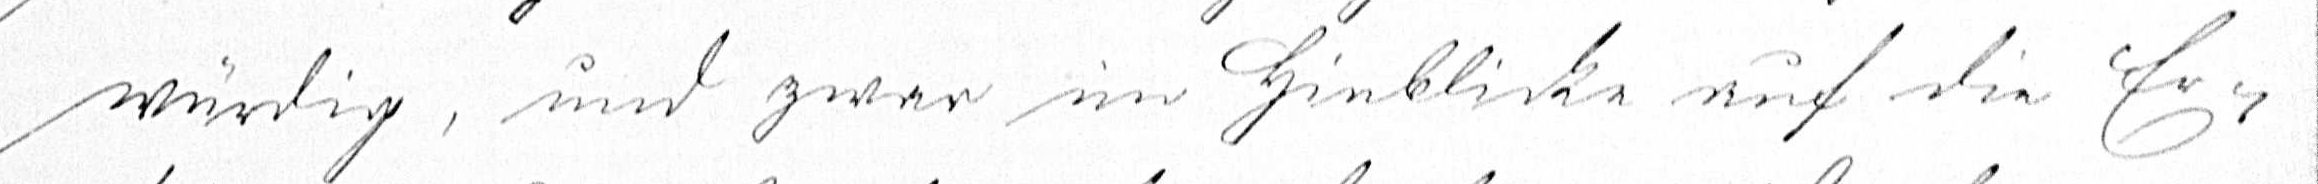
würdig, und zwar im Hinblicke auf die Er¬
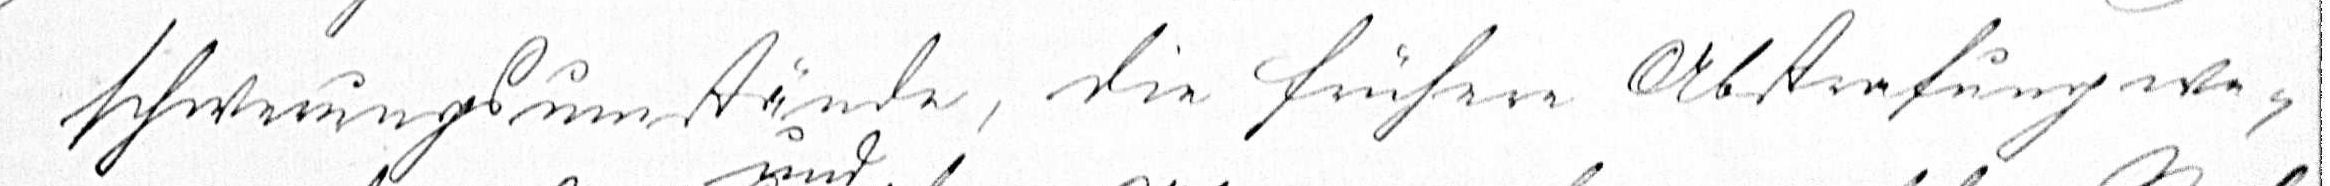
schwerungsumstände, die frühere Abstrafung we¬
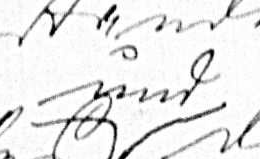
und
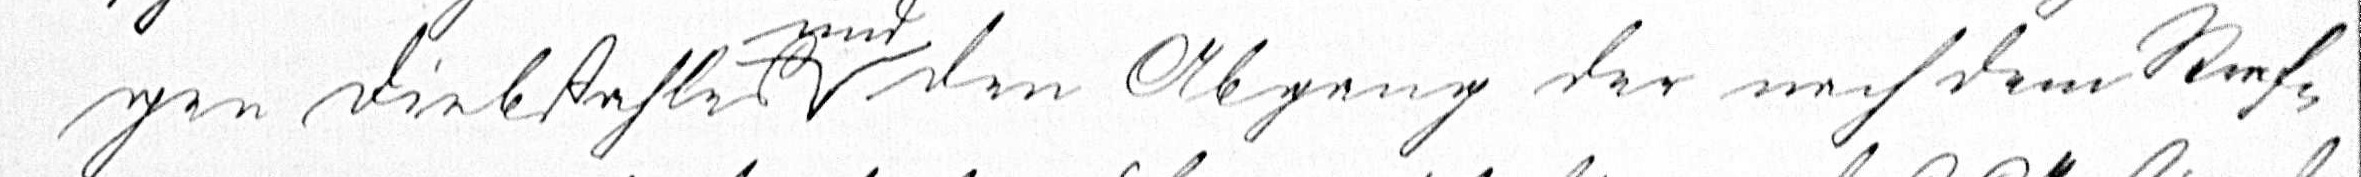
gen Diebsthales den Abgang der nach dem Straf¬
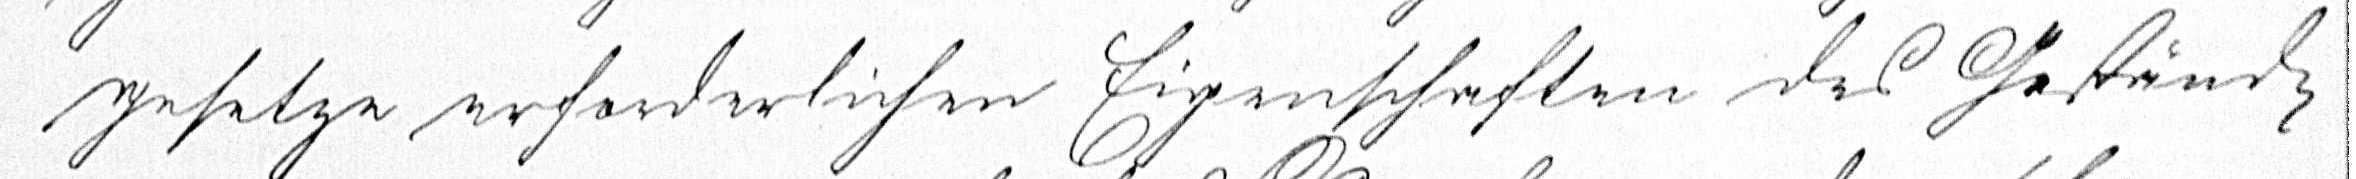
gesetze erforderlichen Eigenschaften des Geständ¬
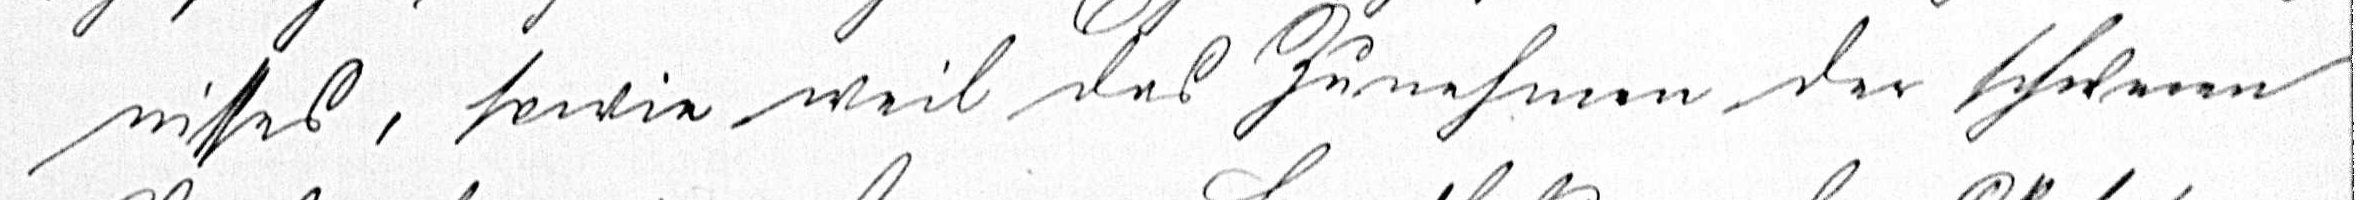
isses, sowie weil das Zunehmen der schweren
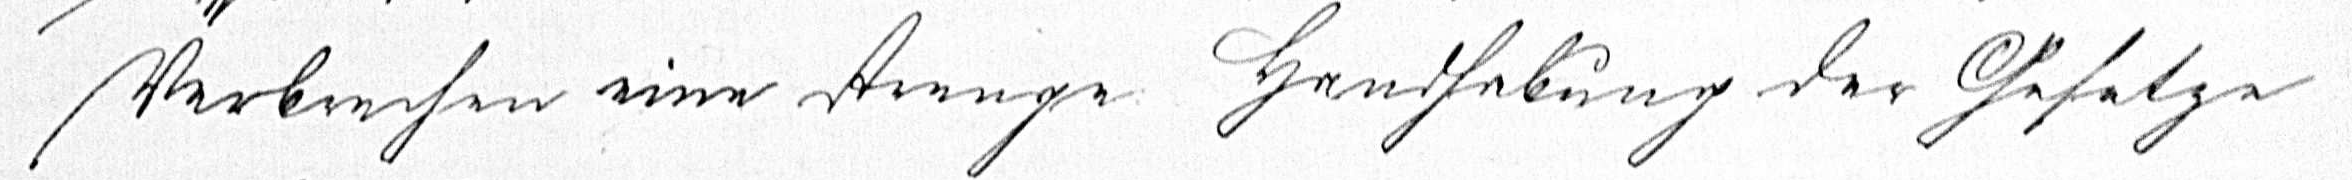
Verbrechen eine strenge Handhebung der Gesetze
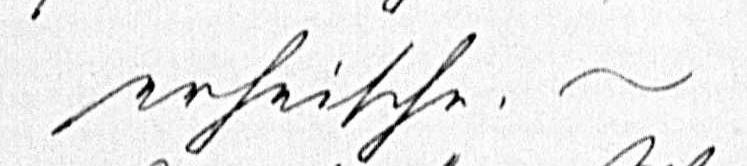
erheische.
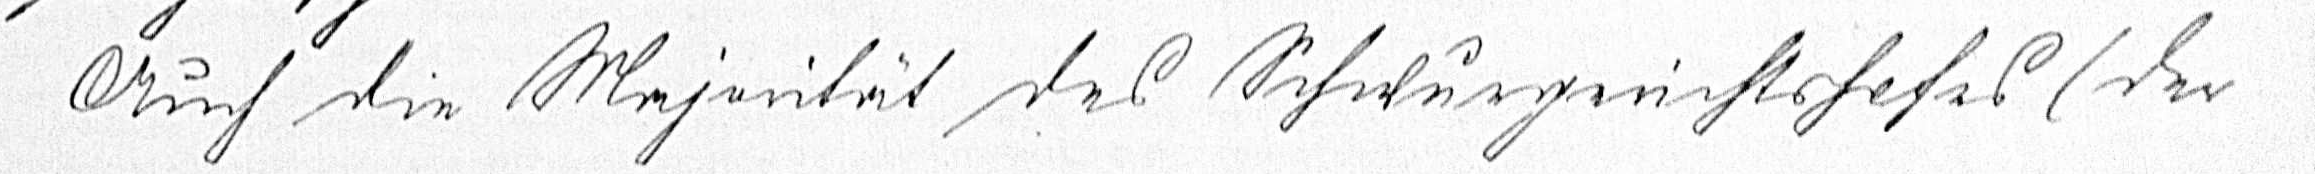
Auch die Majorität des Schwurgerichtshofes (der
